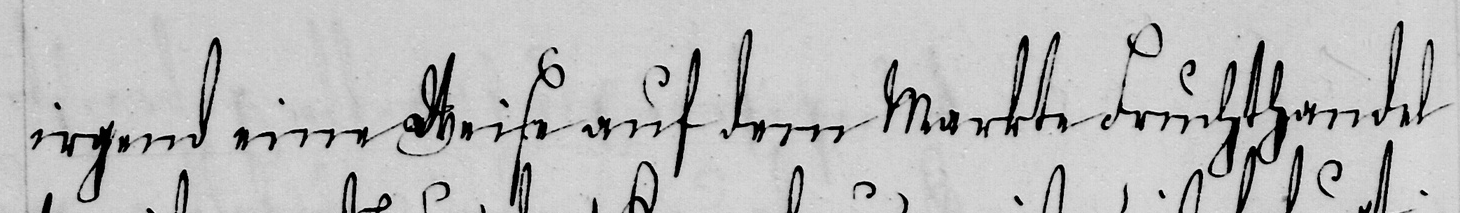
irgend eine Weise auf dem Markte Fruchthandel
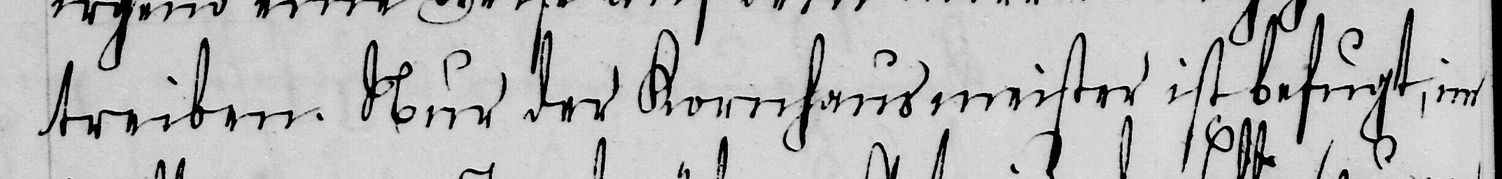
treiben. Nur der Kornhausmeister ist befugt, im
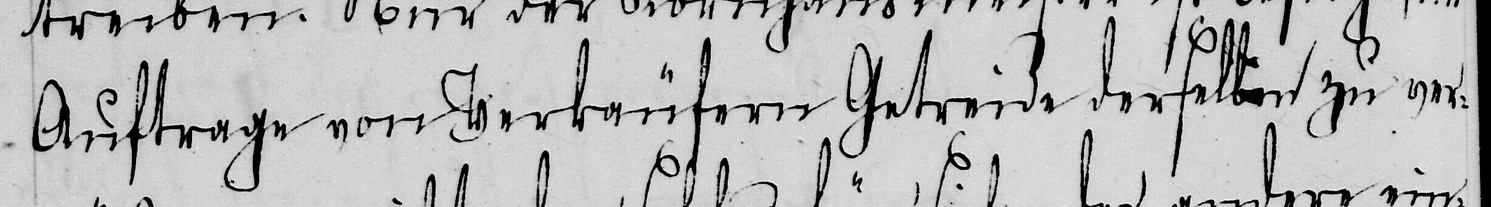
Auftrage von Verkäufern Getreide derselben zu ver¬
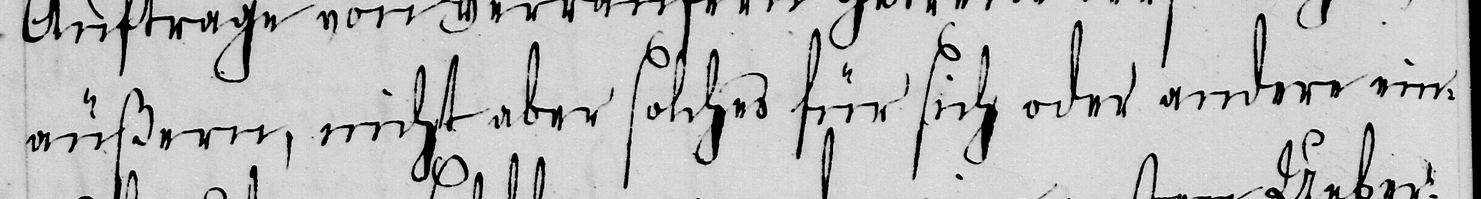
äußern, nicht aber solches für sich oder andere ein¬
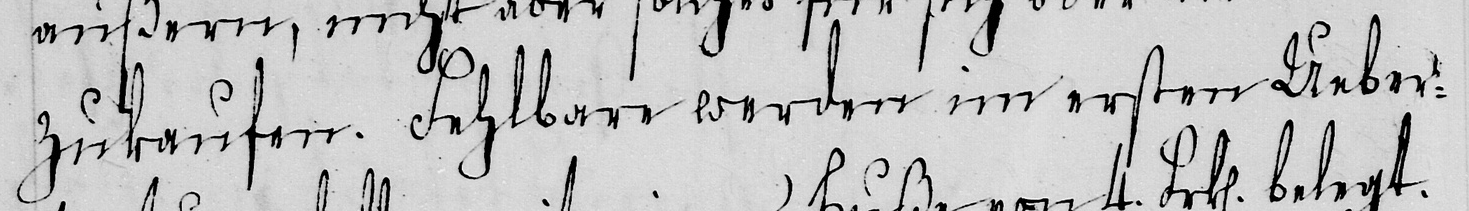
zukaufen. Fehlbare werden im ersten Ueber¬
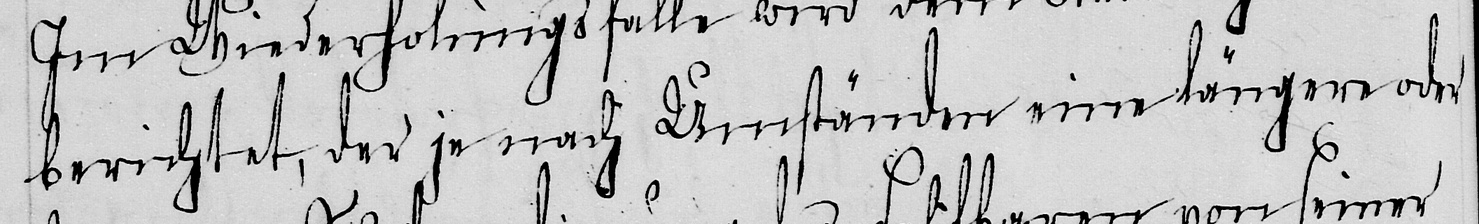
berichtet, der je nach Umständen eine längere oder
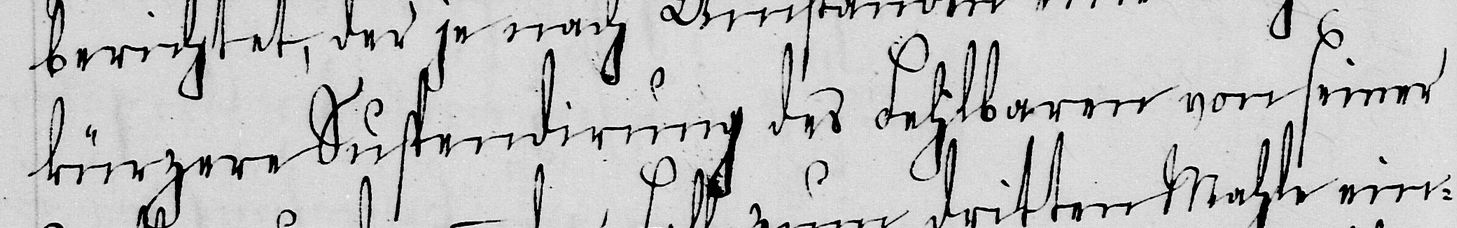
kürzere Suspendirung des Fehlbaren von seiner
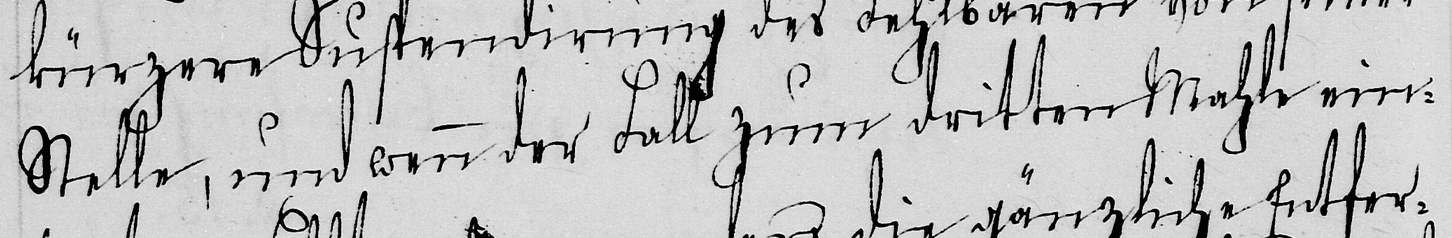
Stelle, und wenn der Fall zum dritten Mahle ein¬
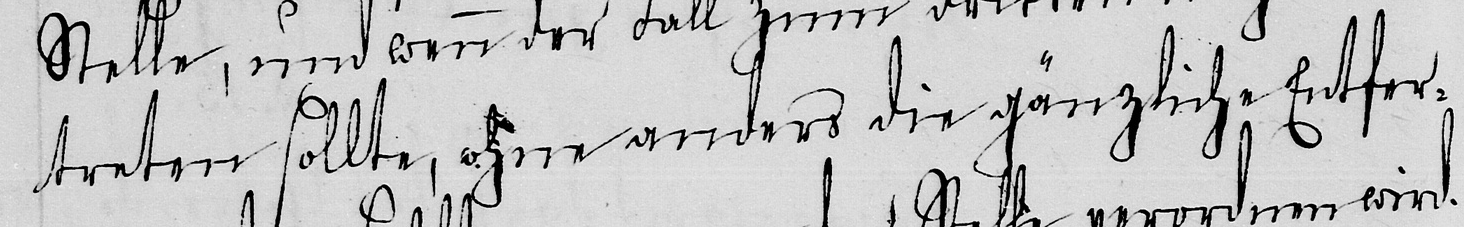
treten sollte, ohne anders die gänzliche Entfer¬
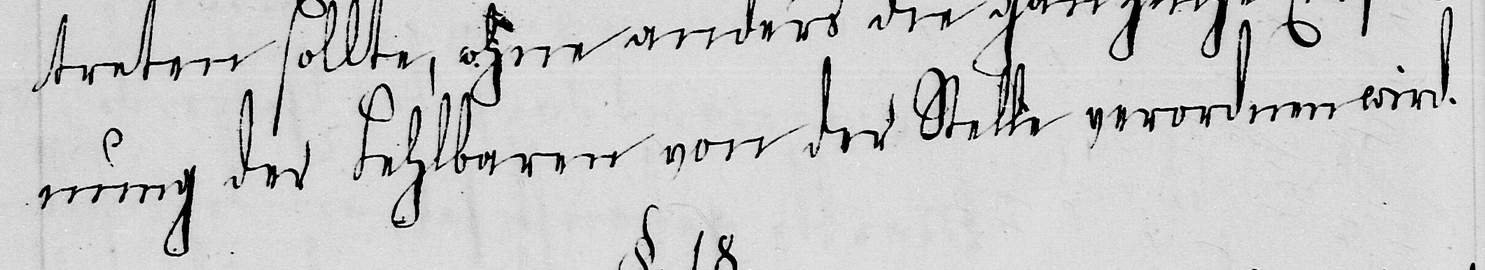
nung der Fehlbaren von der Stelle verordnen wird.
